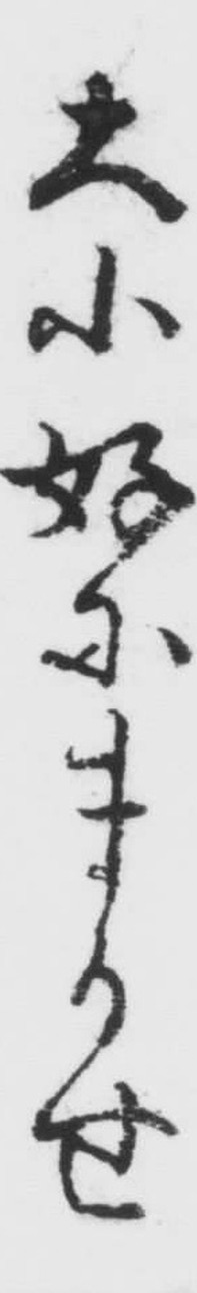大小好にまかせ
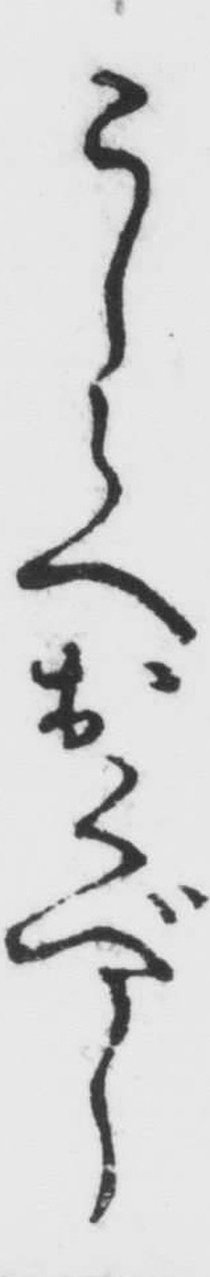こしらへおくべし

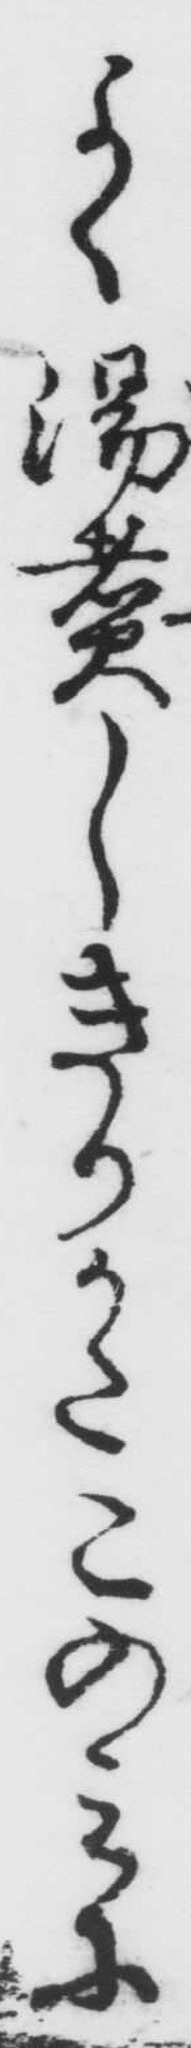よく湯煮しきりかたこのみに
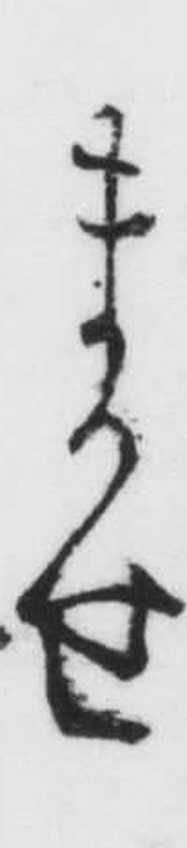まかせ
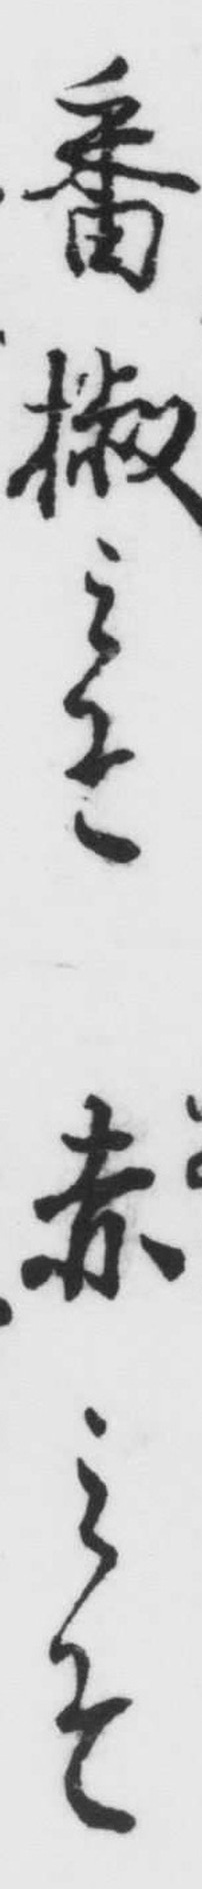番椒みそ赤みそ
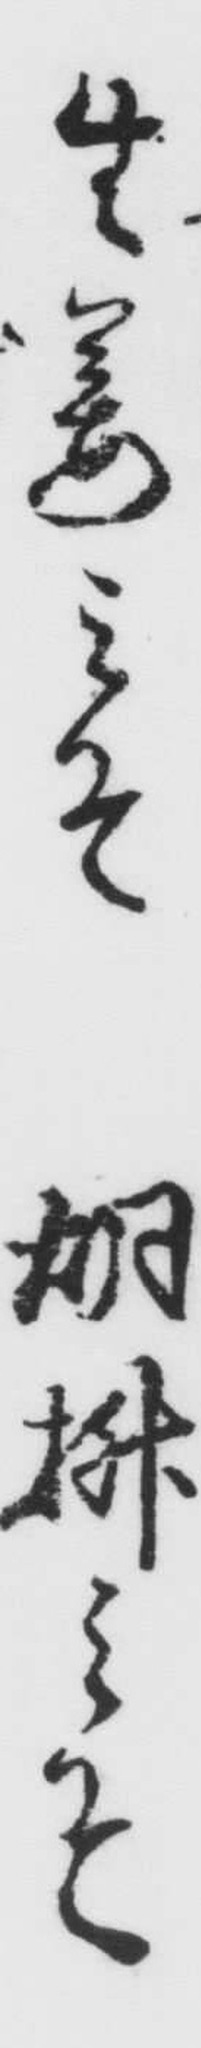生姜みそ胡椒みそ
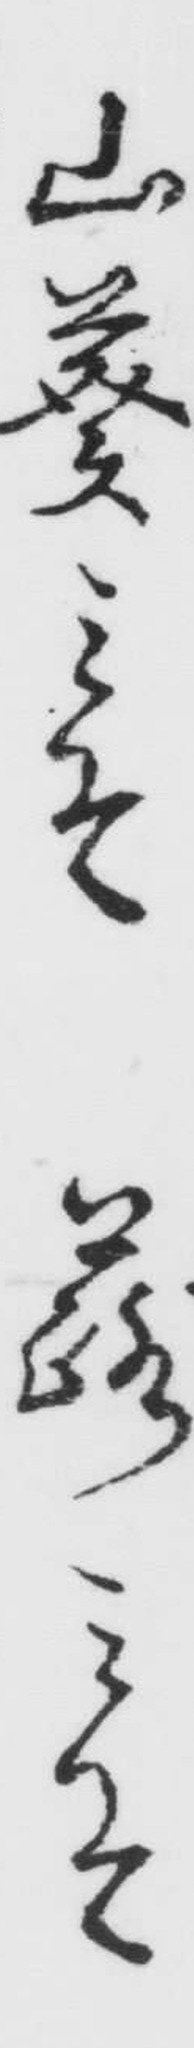山葵みそ蕗みそ
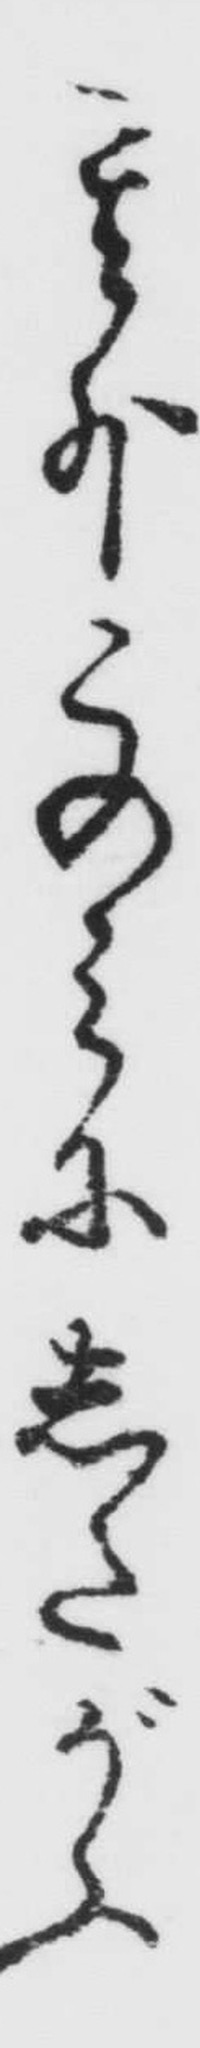其外このみにしたがふ
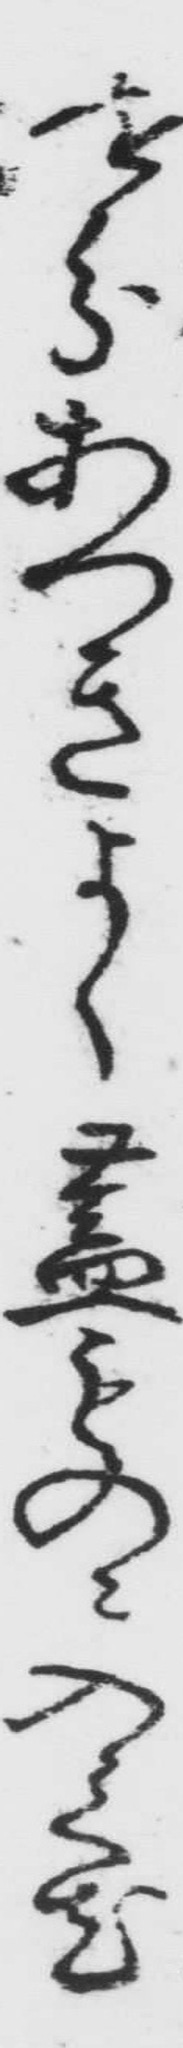随分あつきよく蓋ものに入て尤
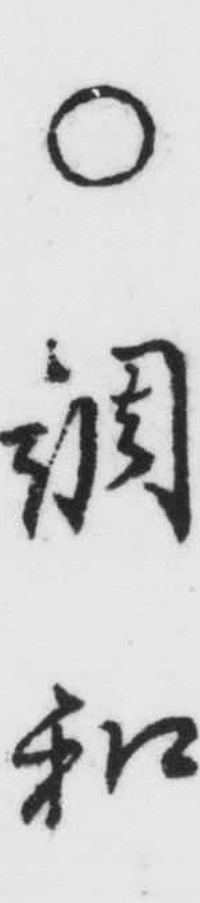○調和
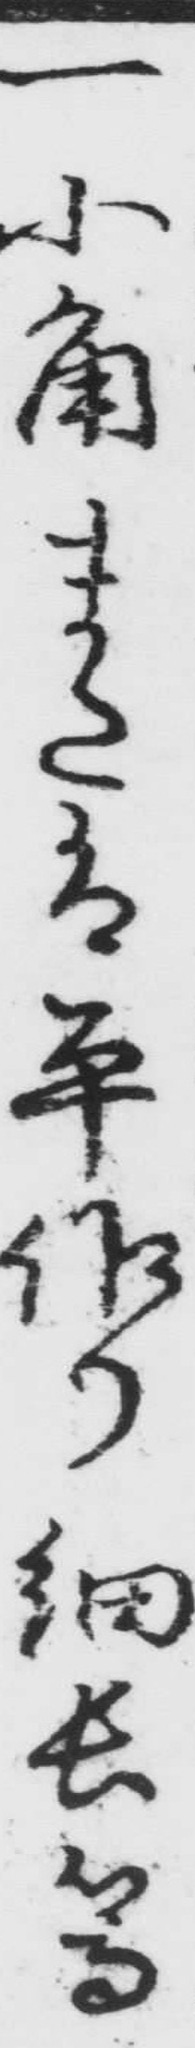一小角または平作り細長等
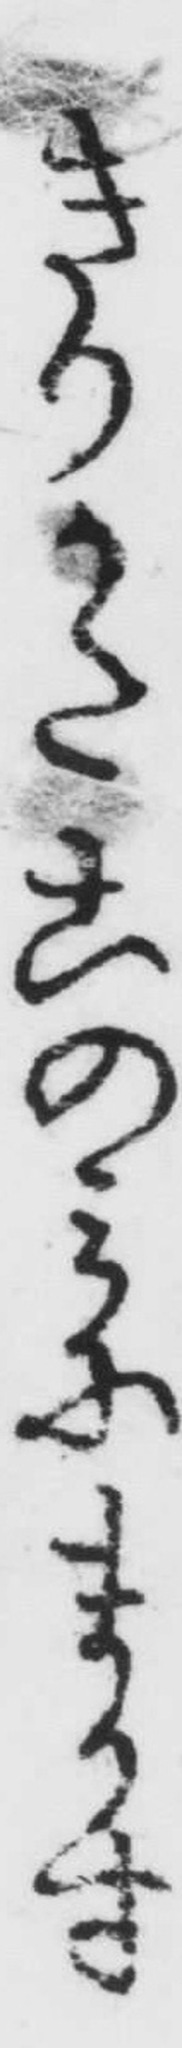きりかたこのみにまかす

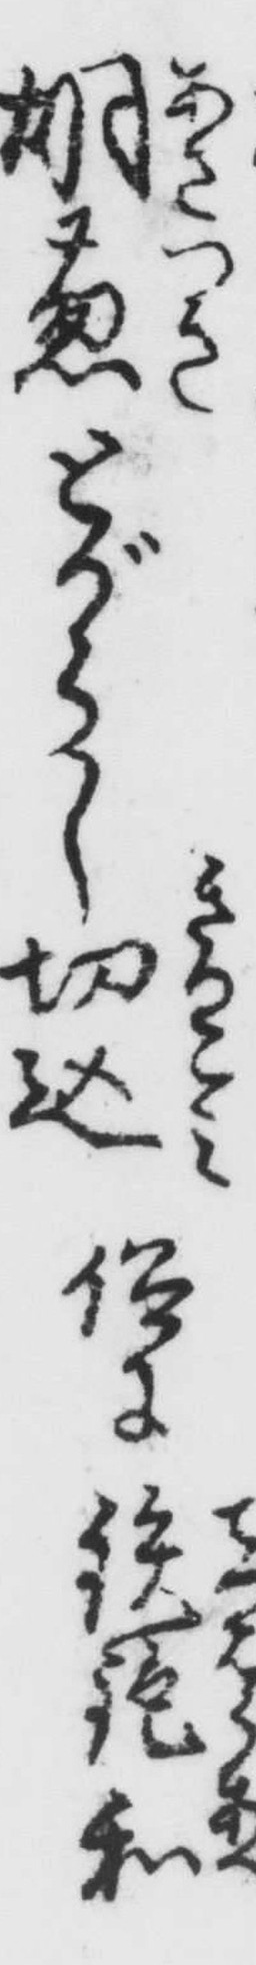胡葱とがらし切込俗に鉄鉋和
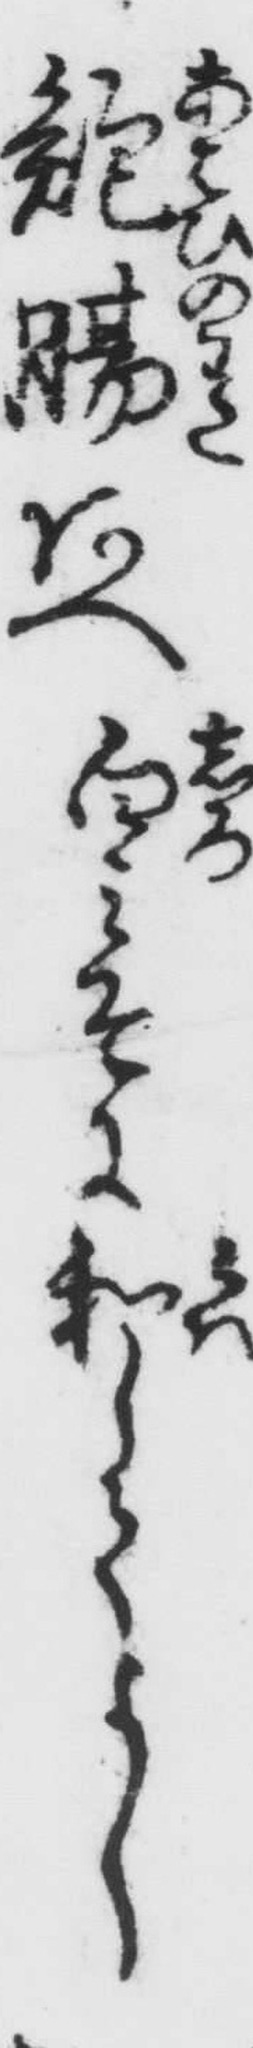鮑腸あへ白みそに和してよし
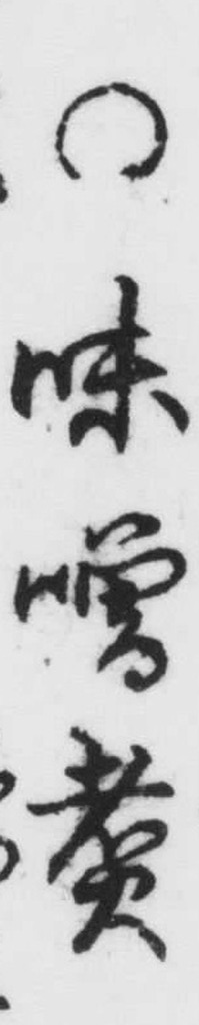○味噌煮
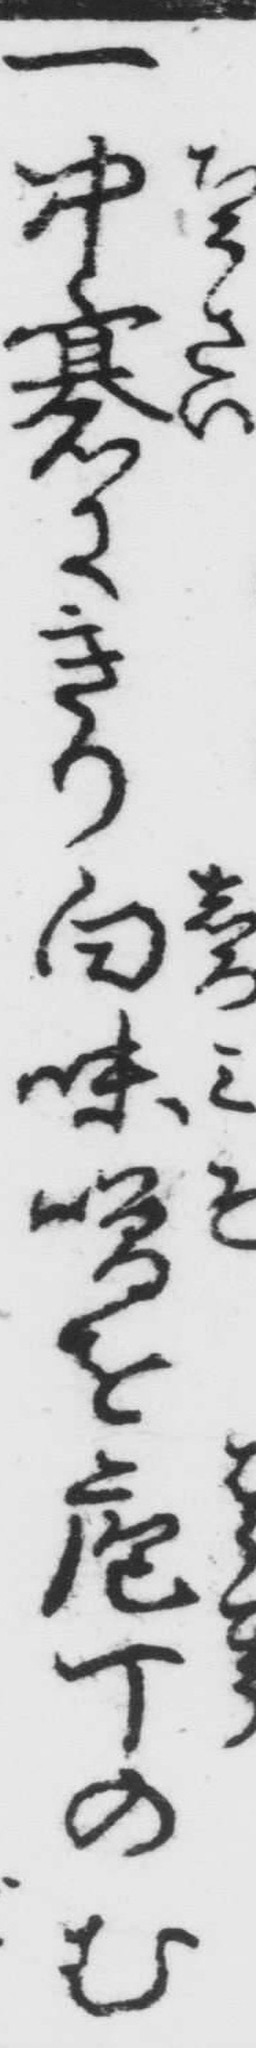一中賽にきり白味噌を庖丁のむ
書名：蒟蒻百珍
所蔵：大阪府立大学学術情報センター 国文学研究資料館
